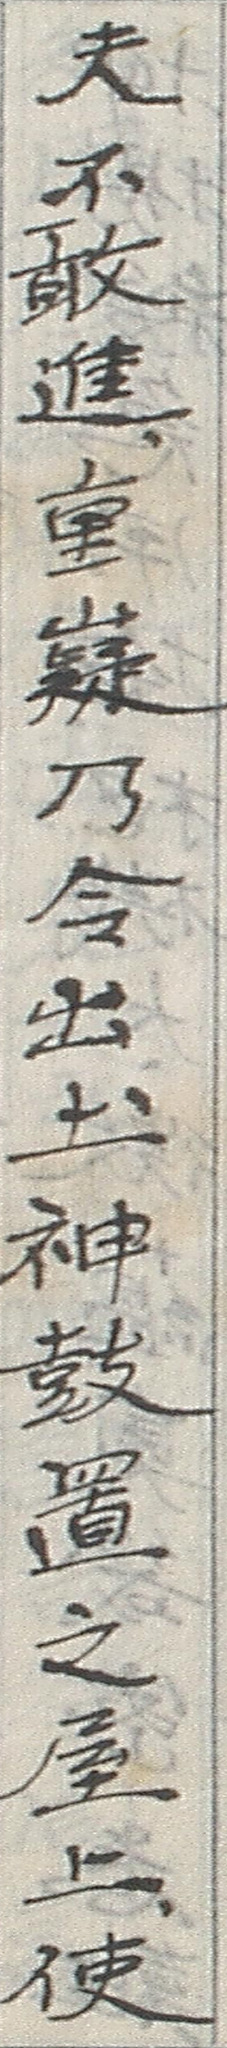夫不敢進、重嶷乃令出、土神鼓置之屋上、使
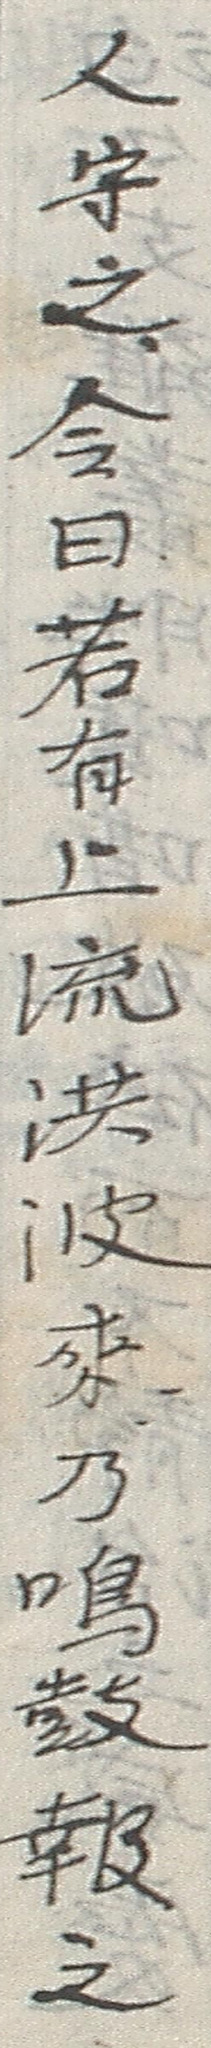人守之、今日若有上流洪波來、乃鳴鼓報之
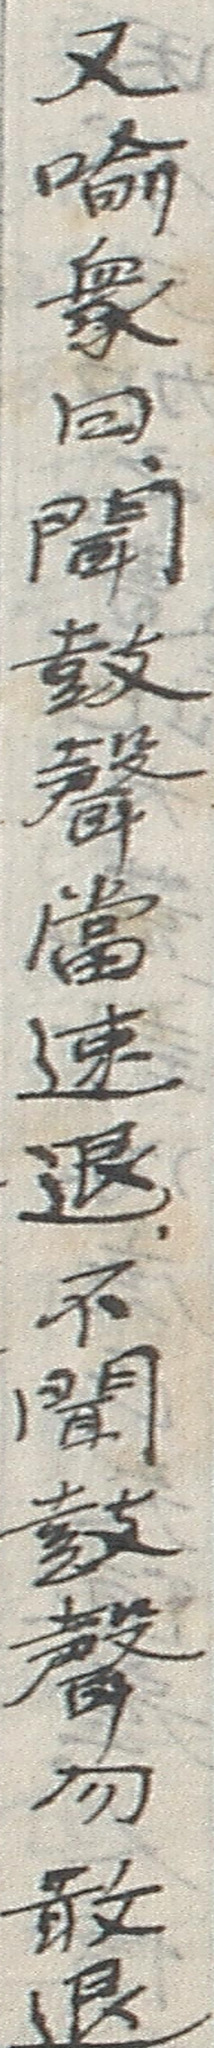又諭衆曰、聞鼓声当速退、不聞鼓声勿敢退

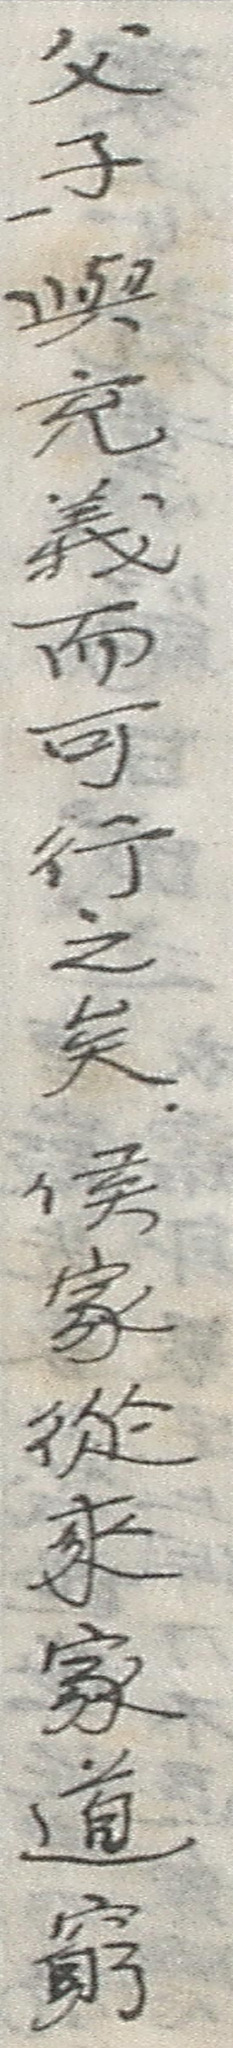父子與充義而可行之矣候家従来家道窮
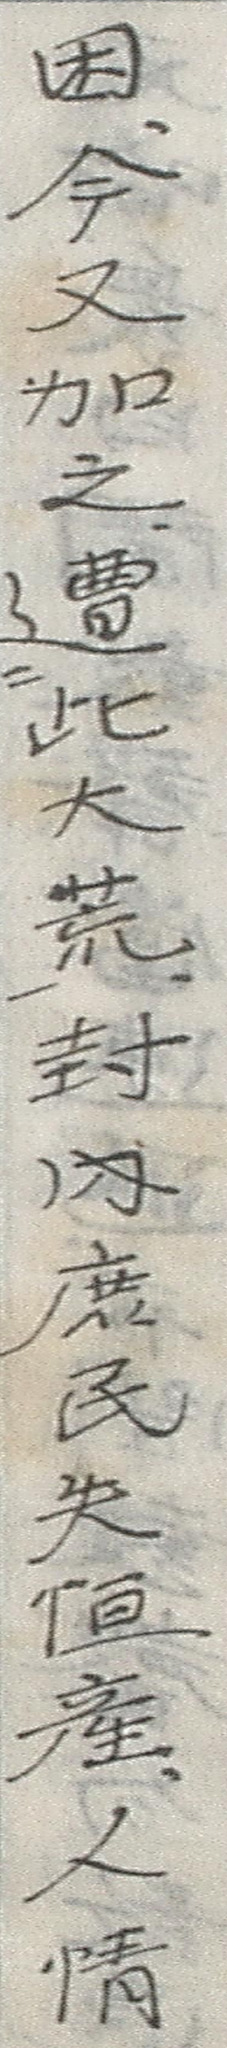困、今又加之、遭此大荒封内庶民失恒産、人情
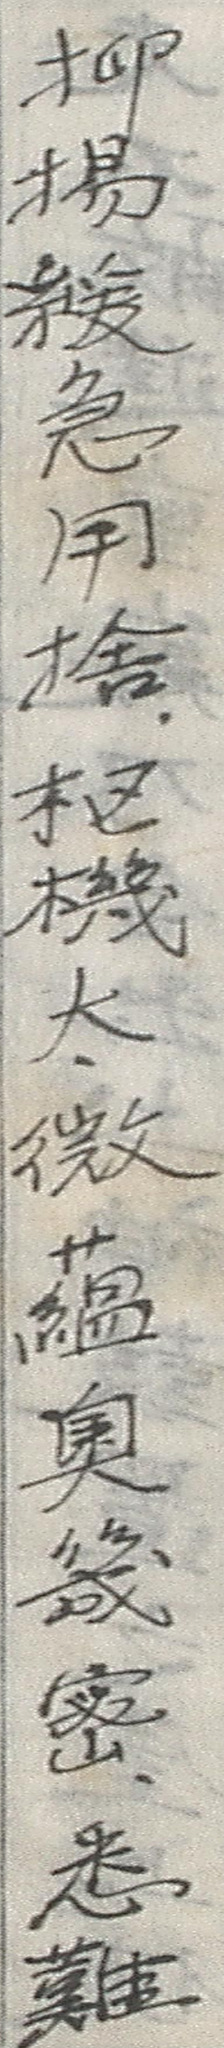抑揚緩急用捨、枢機太微蘊臭幾密悉難
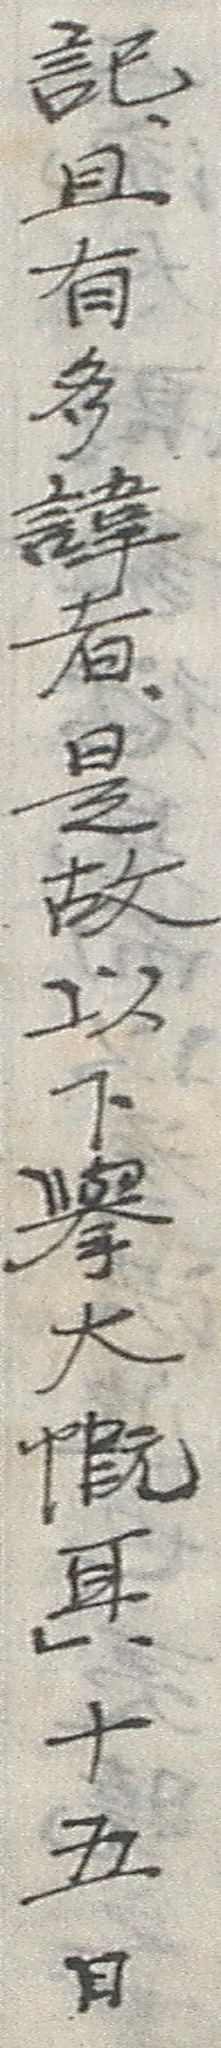記、且有多諱者、是故以下挙大慨耳」、十五日
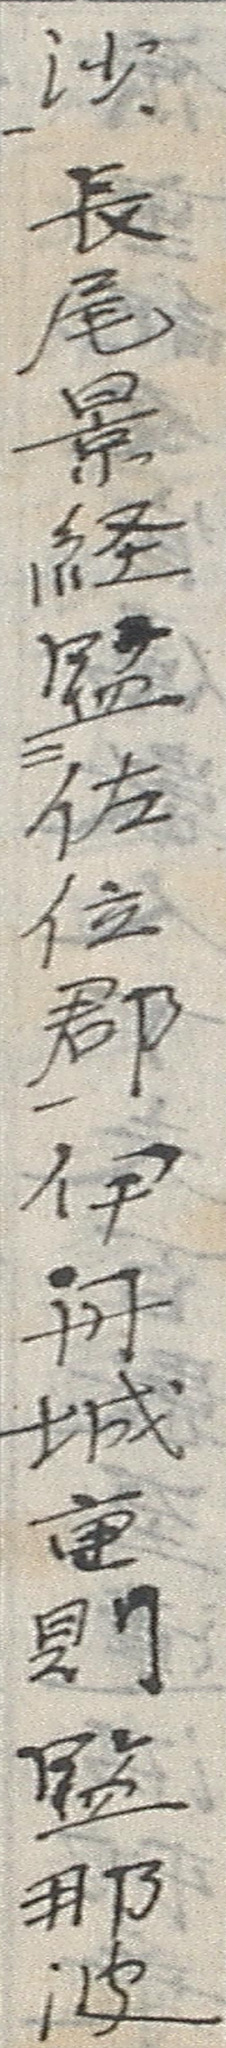沙、長尾景経鑑佐位郡伊丹城重則鑑那波
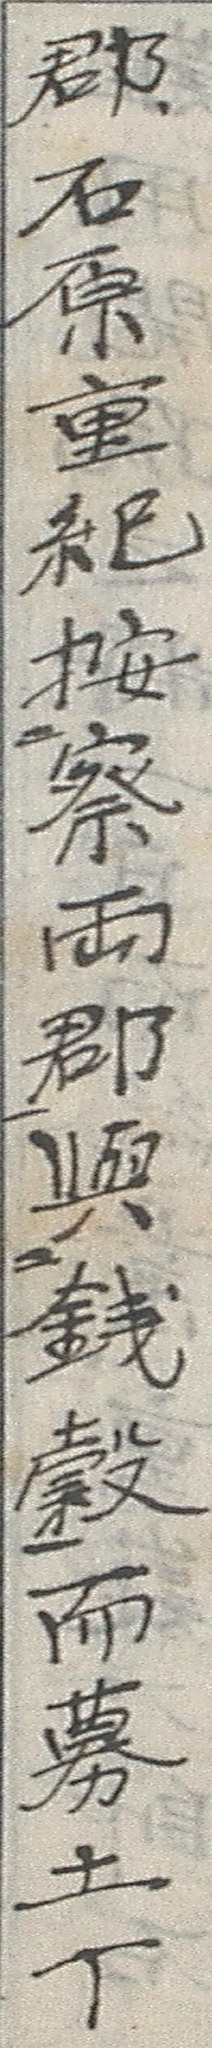郡、石原重紀按察両郡興銭穀而募土丁
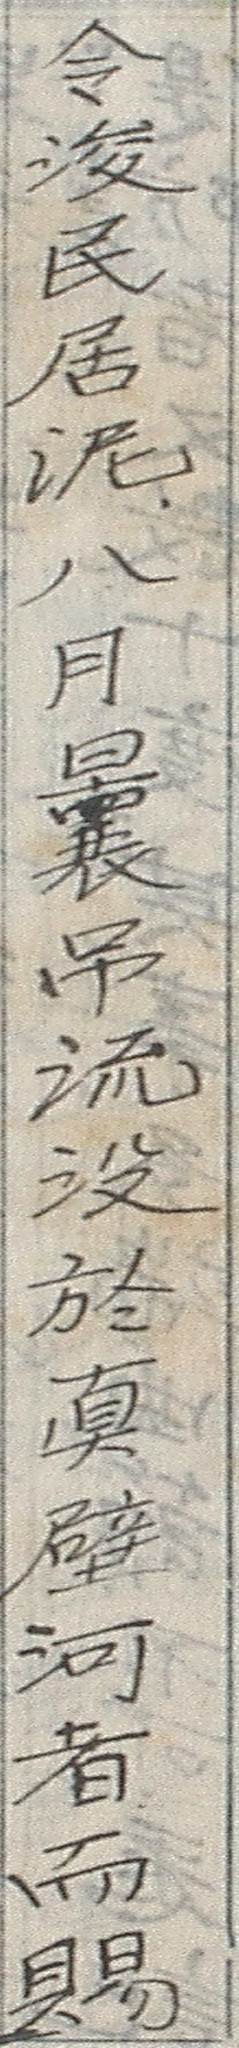令浚民居泥、八月曩吊流設於真壁河者而賜
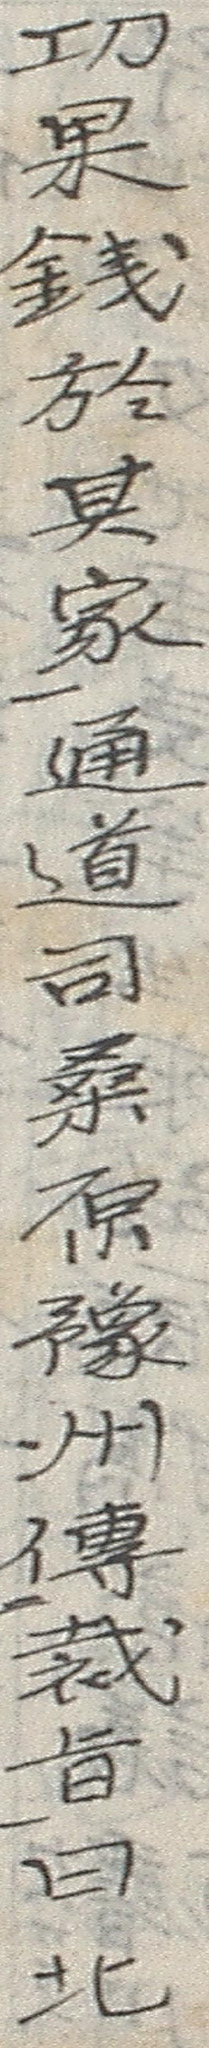功果銭於其家通道司桑原豫洲伝栽旨曰北
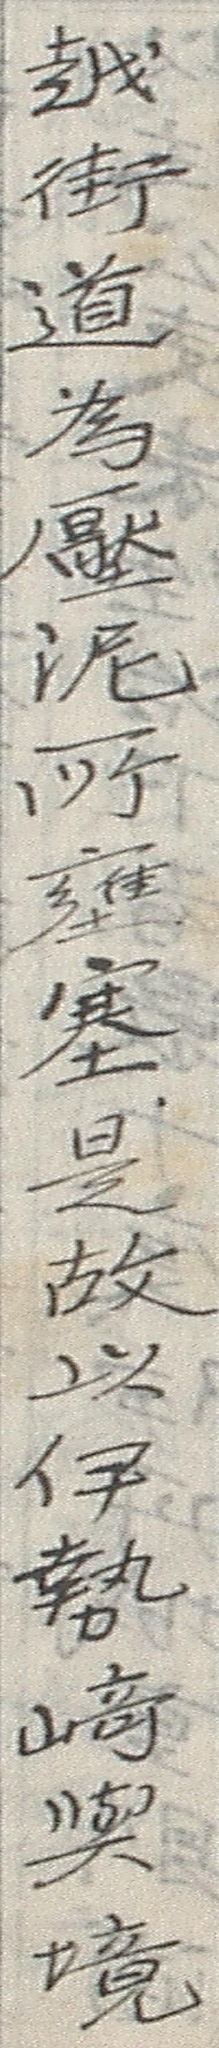越街道為壓泥所壅塞、是故以伊勢崎興境
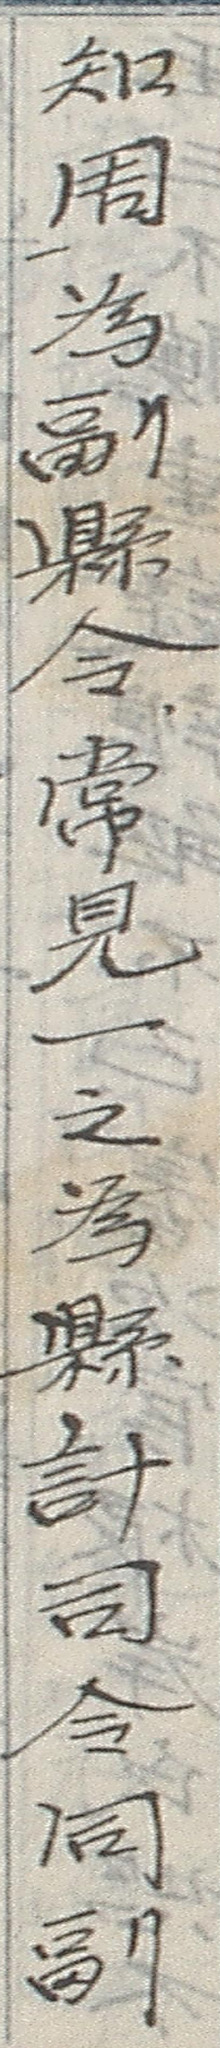知周為副県令、常見一之為県計司令同副
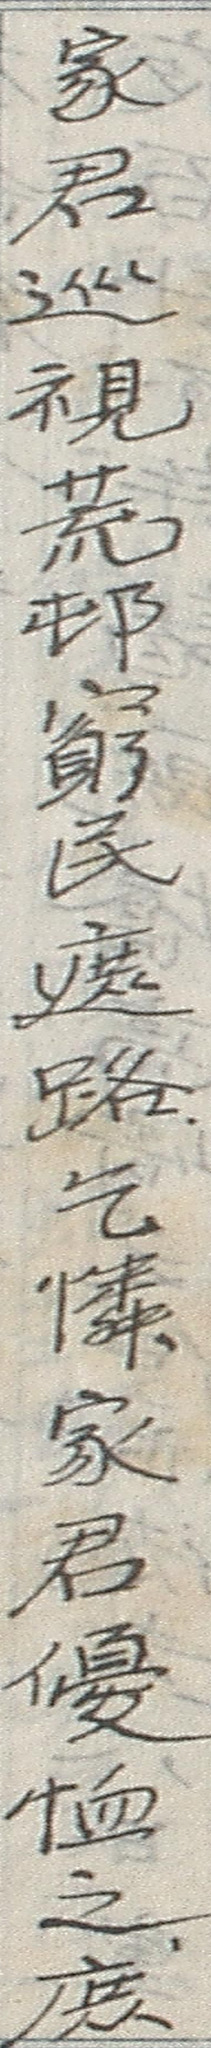家君巡視荒邨窮民遮路、乞隣家君優血恤之、庶
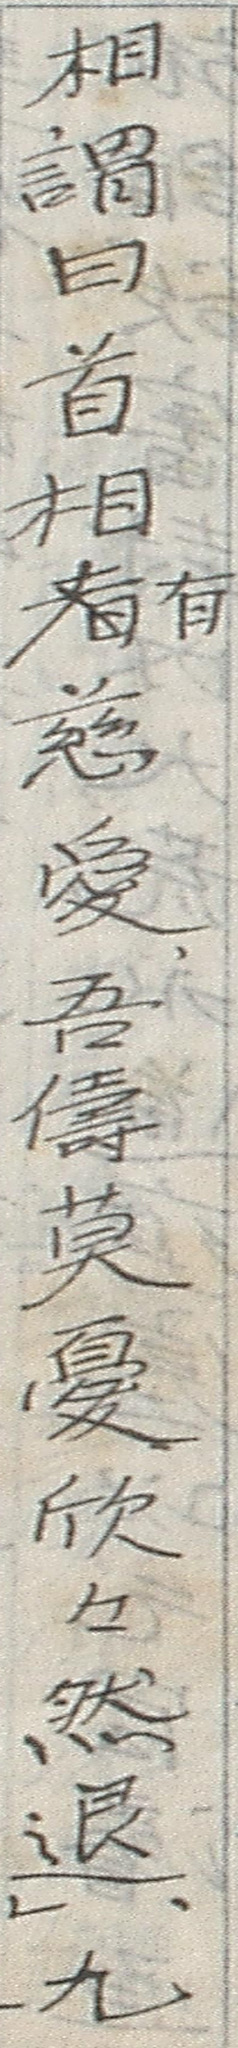相謂曰首相有慈愛、吾儔莫憂欣々然退ㇾ、九
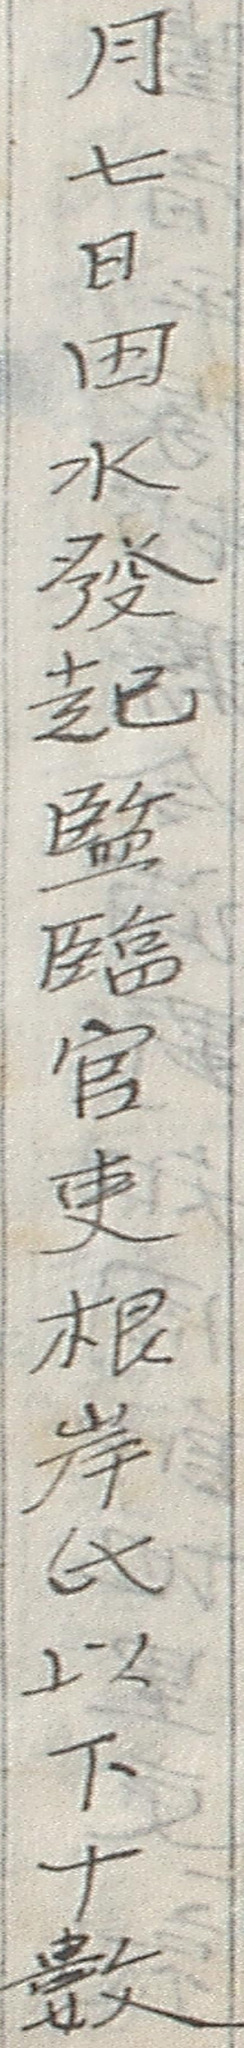月七日田水発起監臨官吏根岸氏以下十数
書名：天明三年癸卯六月　沙降記　［蕗原拾続巻之五十二］
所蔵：東京大学地震研究所図書室 Earthquake Research Institute Library, The University of Tokyo, JAPAN
